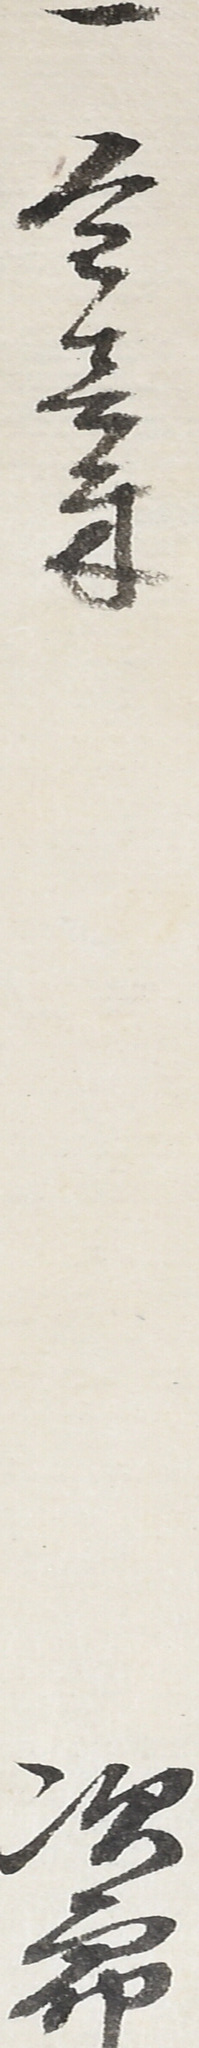一金壱朱次郎吉
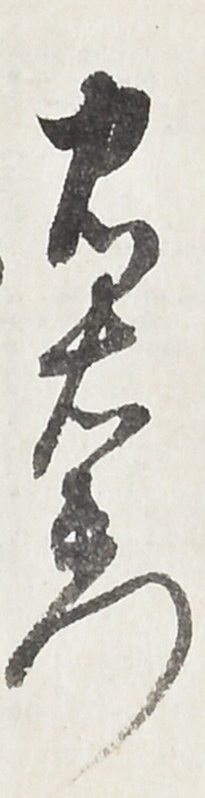忠右衛門
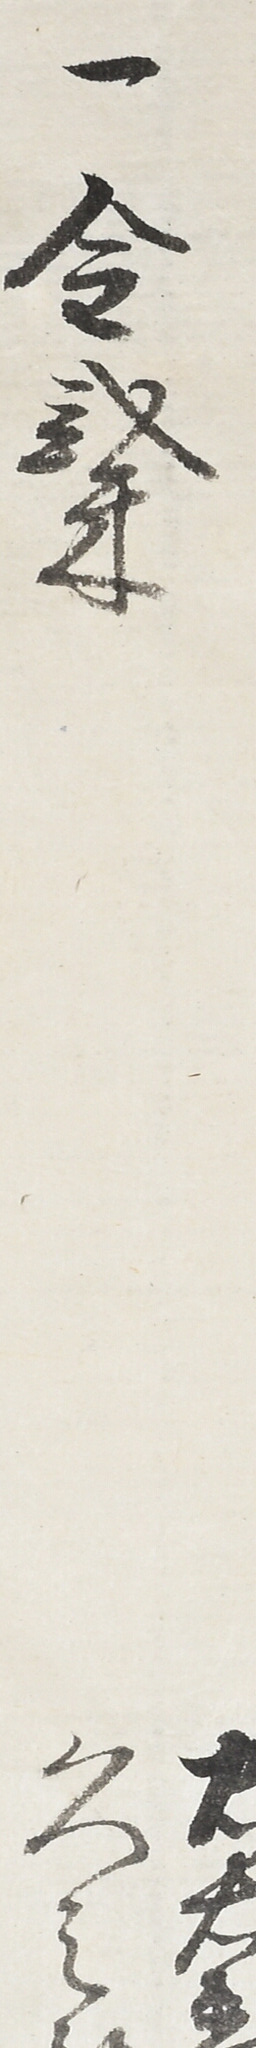一金弐朱久之丞
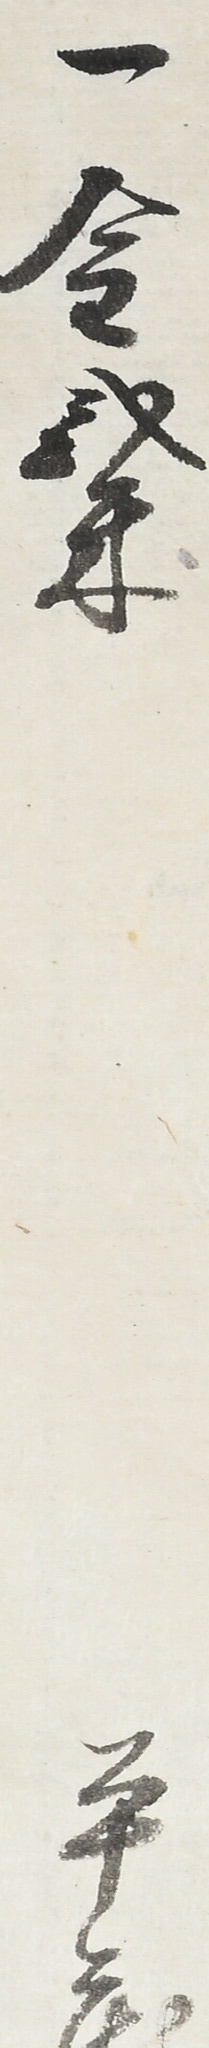一金弐朱平蔵
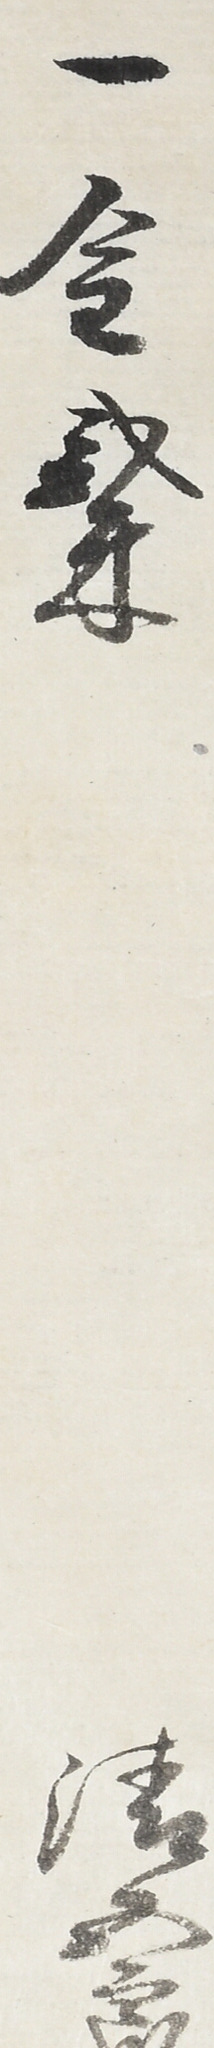一金弐朱清五郎

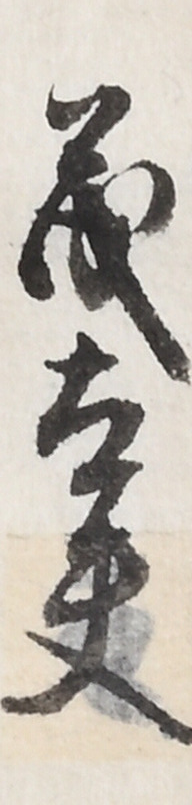茂太夫
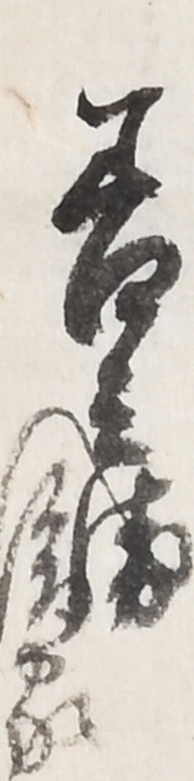嘉兵衛
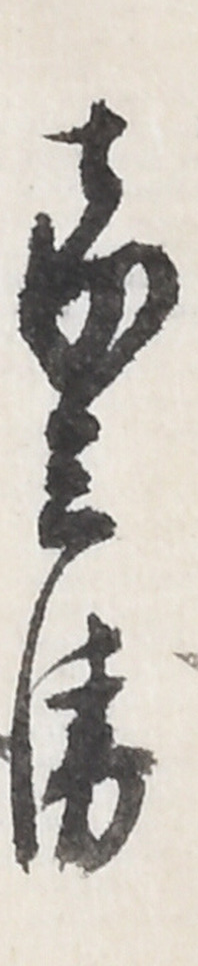嘉兵衛
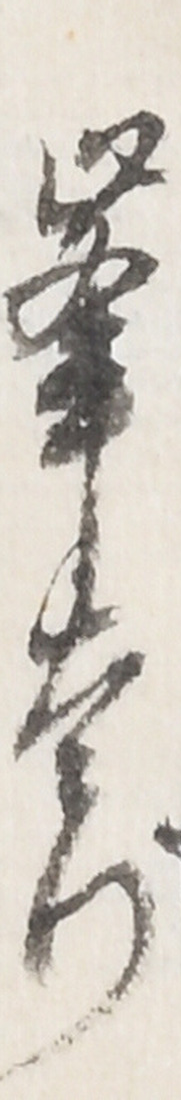峯右衛門
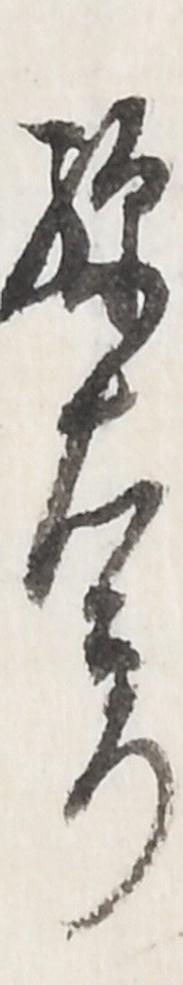峯右衛門
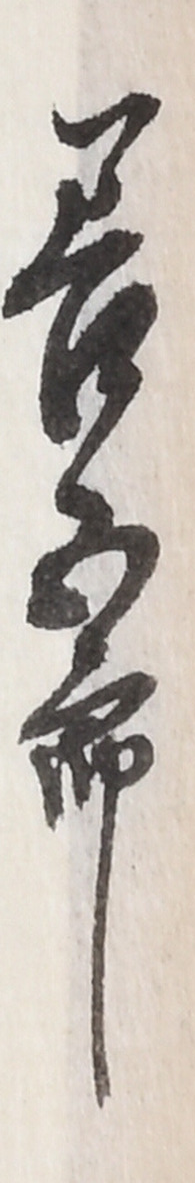善五郎
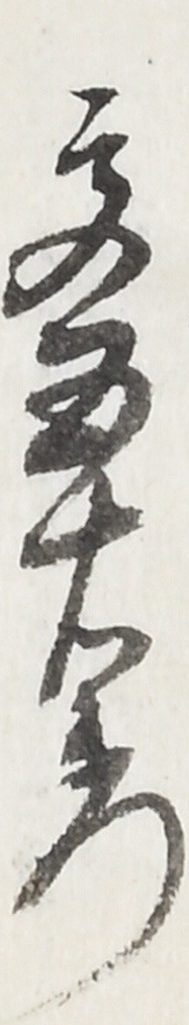多五右衛門
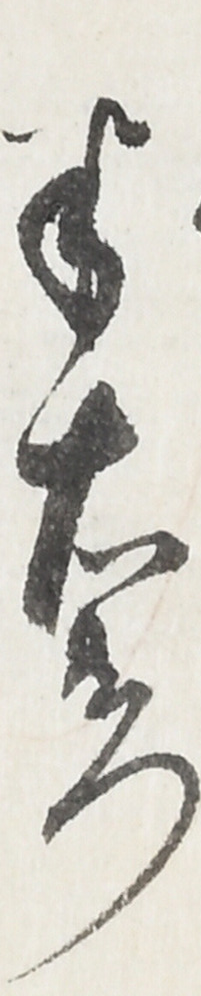半右衛門
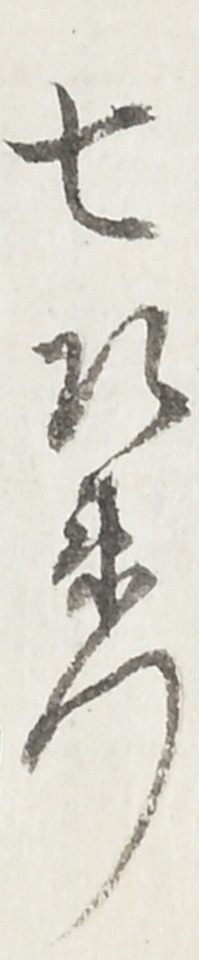七左衛門
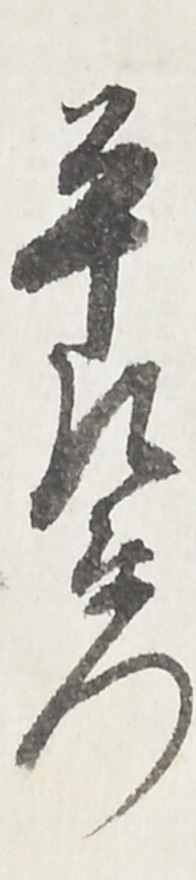平左衛門
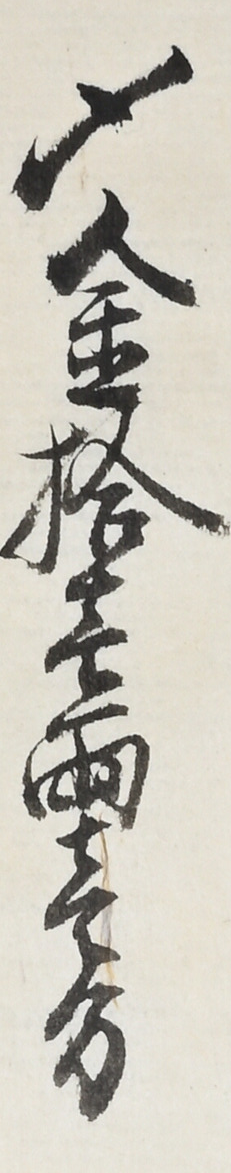〆金拾壱両壱分
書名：御拝地百五拾年御祝儀献上御目録名前
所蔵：伊那市立高遠町図書館・合同会社AMANE
